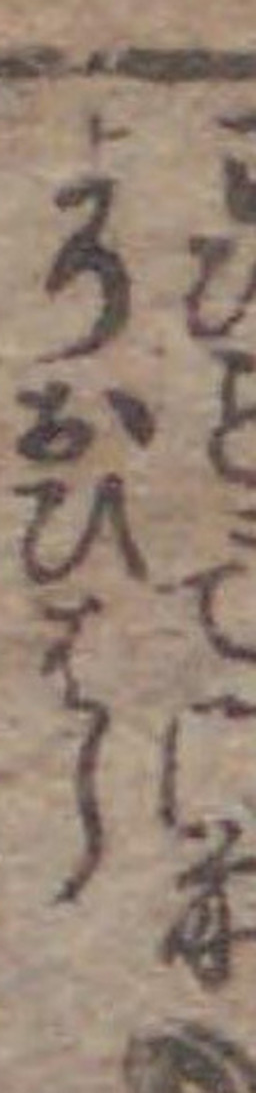よりおひはら

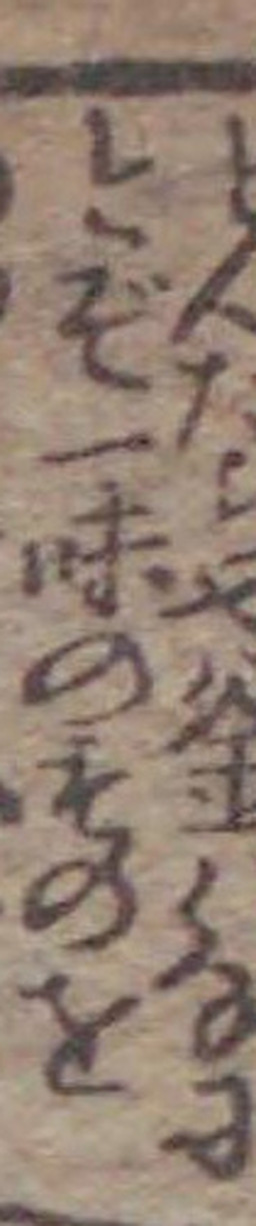とぞ一味のものを
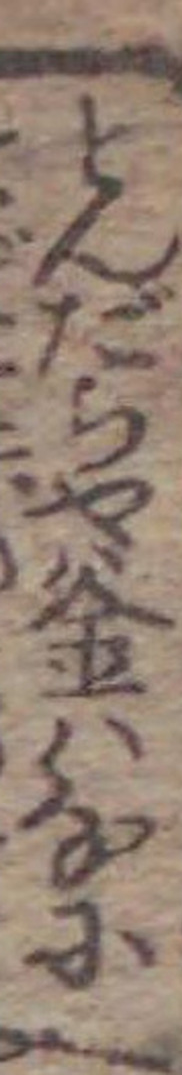とんだちや釜はなに
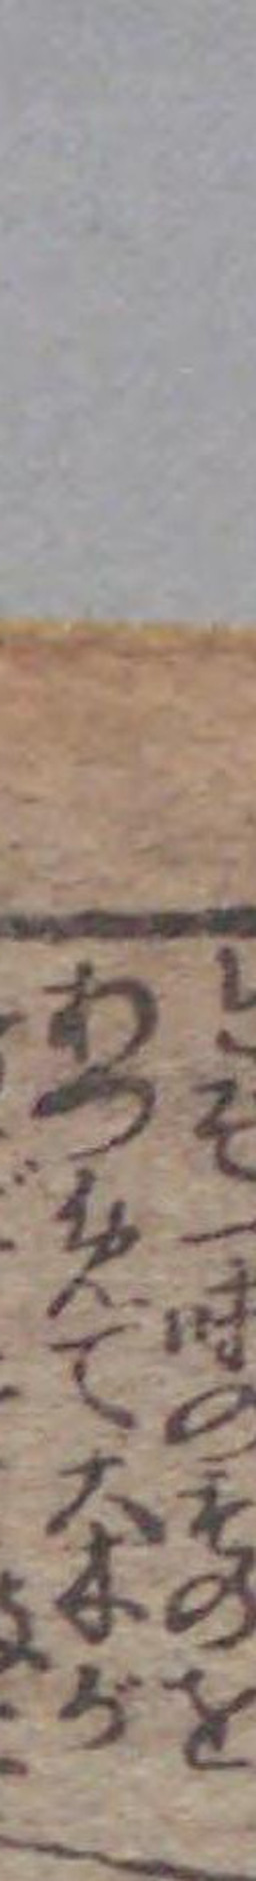あつめて大木が
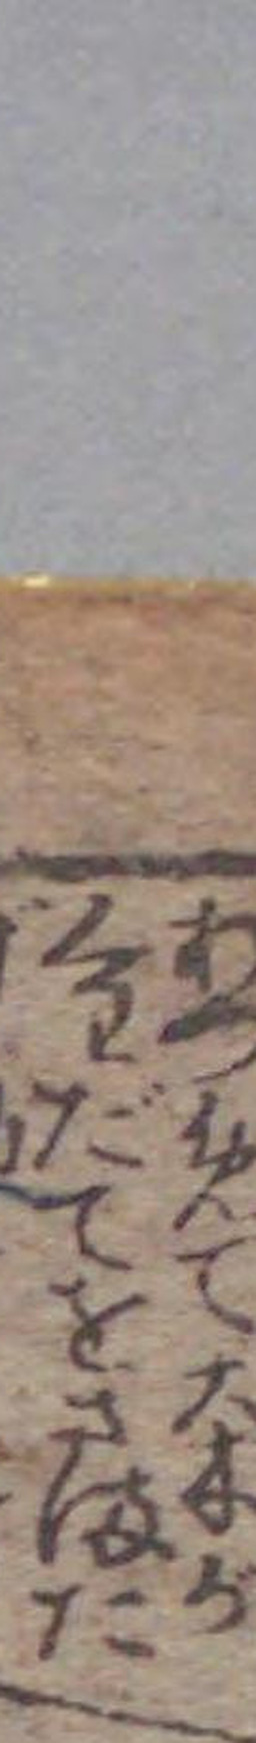くわだてをさまた
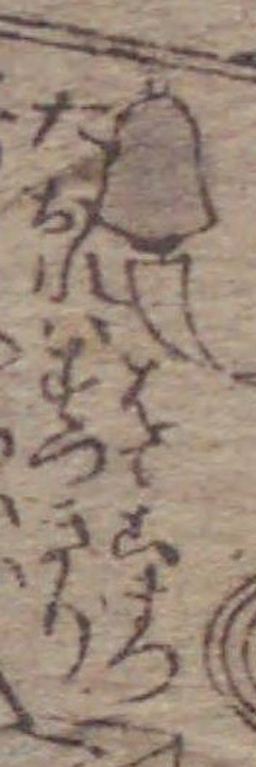たおれはすつきり
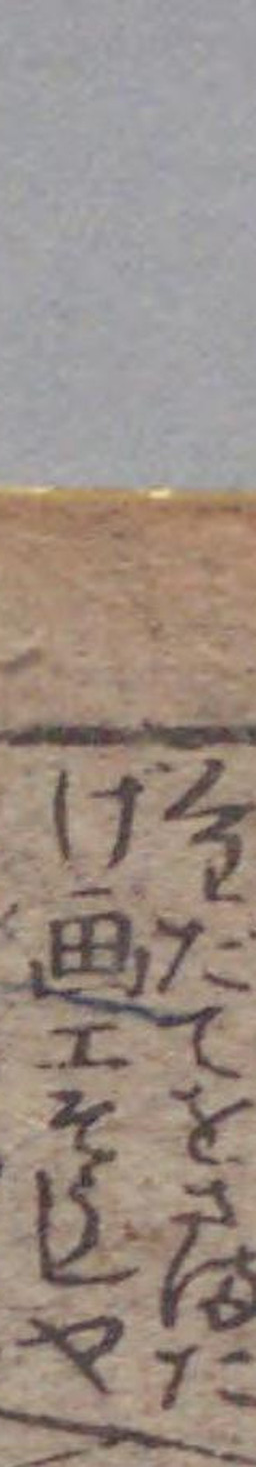げ画工そうしや
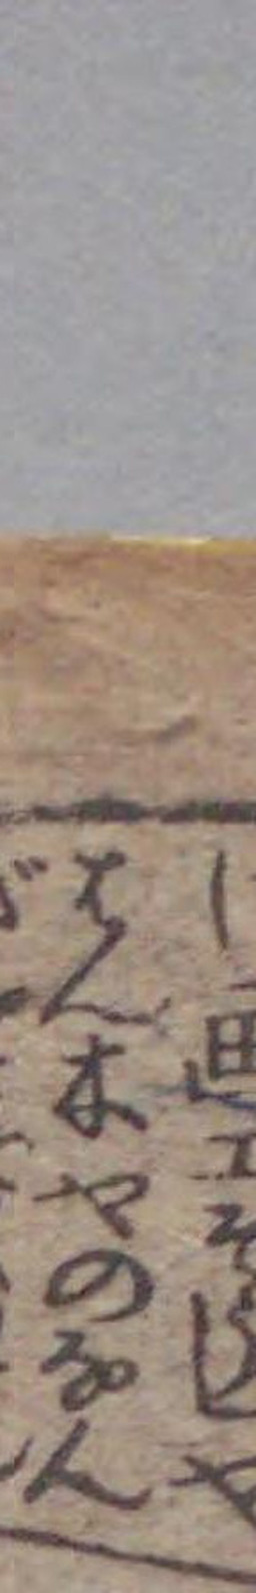はん木やのなん
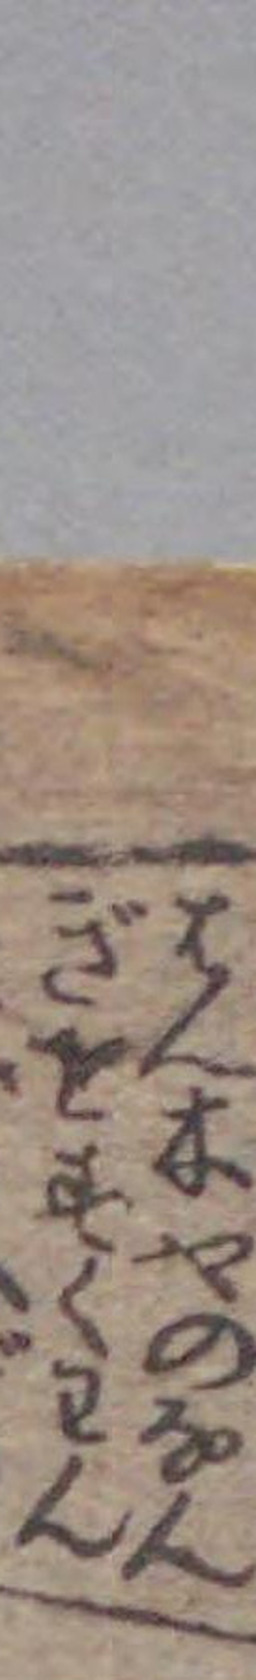ぎをすくわん
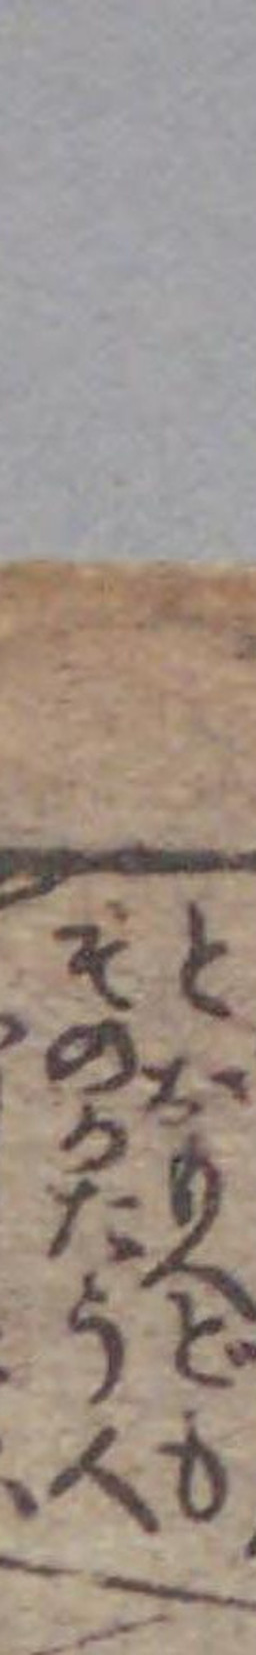そのかたう人
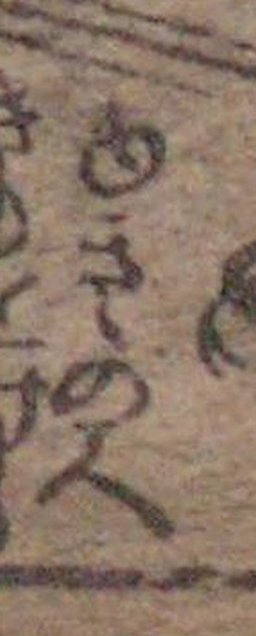ゆきゝの人
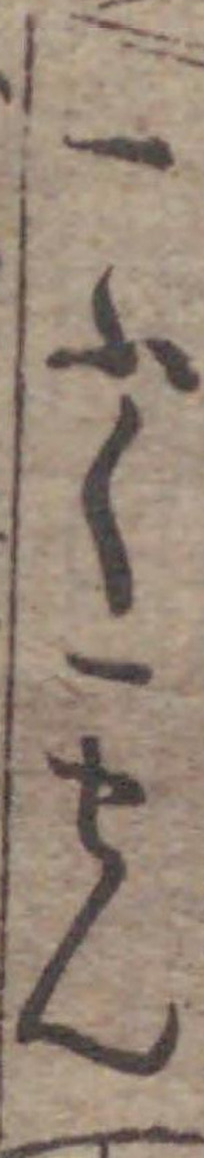一ふく一せん
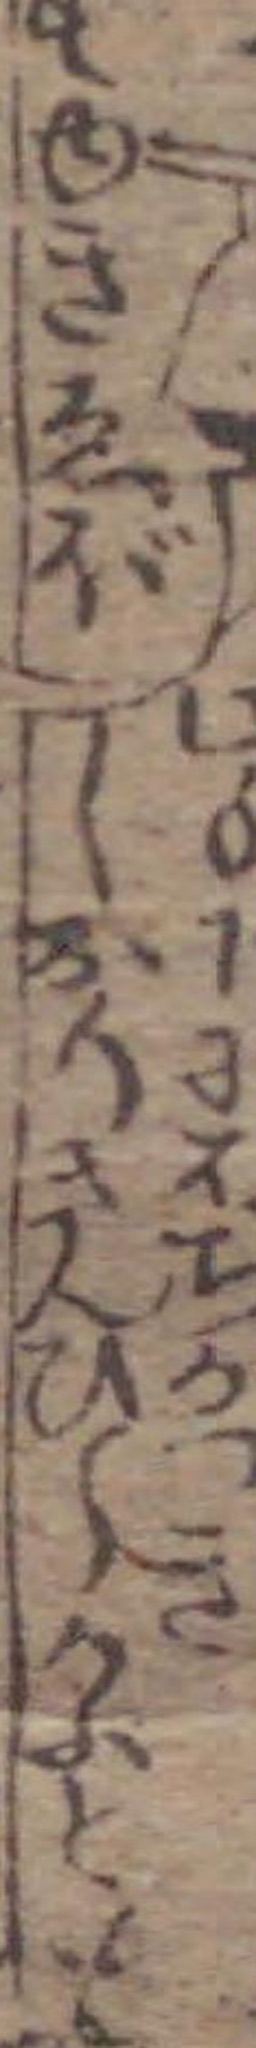うすゆきゑぼしおりきんひらかふと
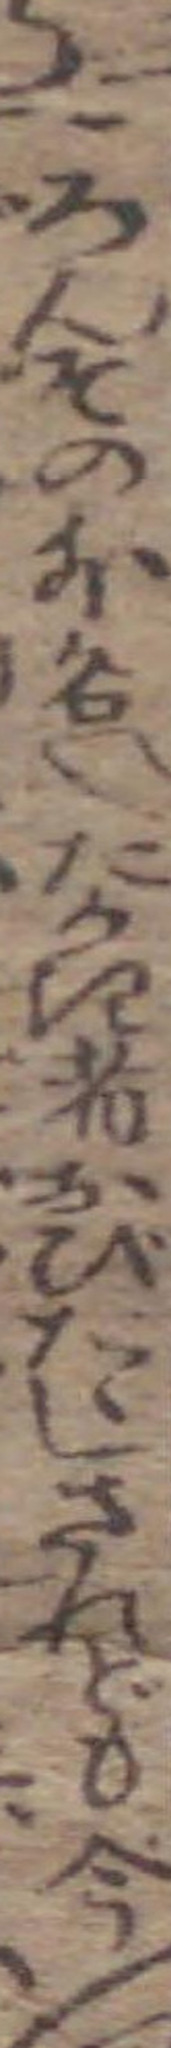ろんその外名たかき者おびたゝしされども今
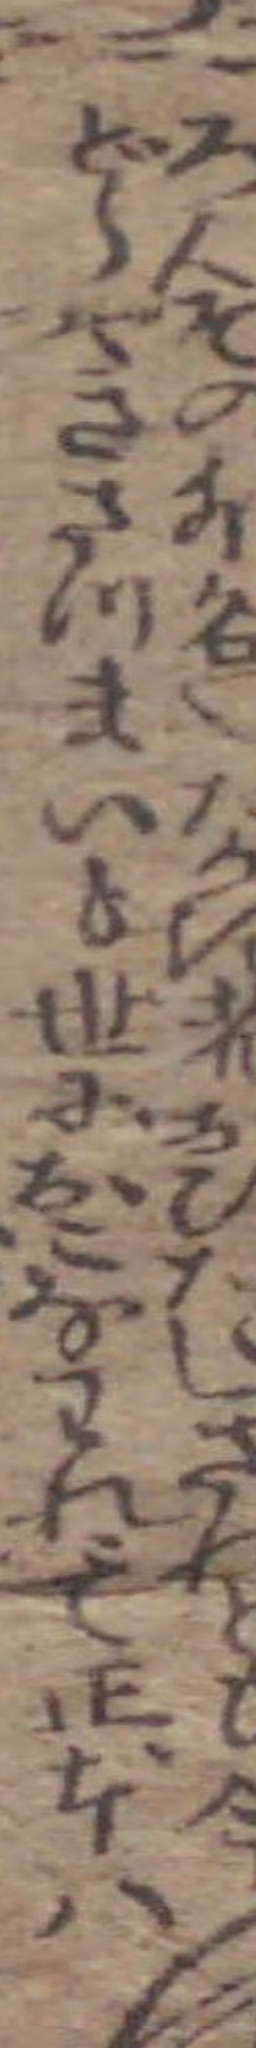どらやきさつまいも世におこなわれで正本は
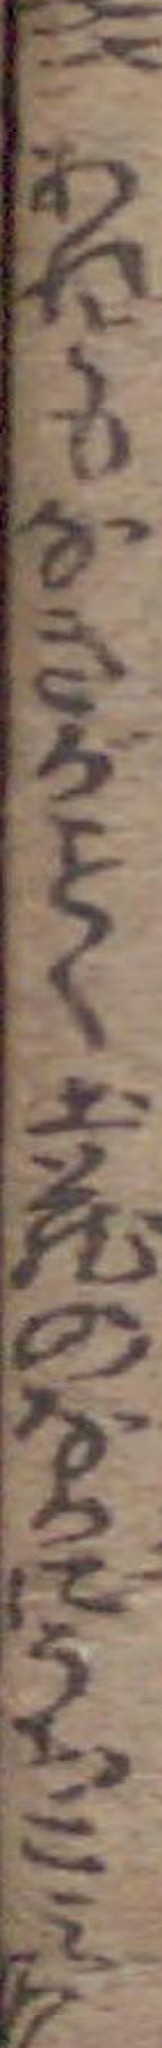あれともなきがことく土蔵のなかにうちこみ
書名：辞闘戦新根 （国会）
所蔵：国立国会図書館 National Diet Library, JAPAN
